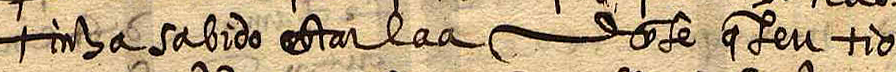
tinha sabido estar laa dyse q̄ seu tio
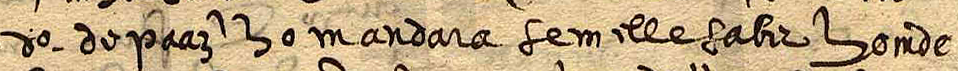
do. de paaz ho mandara sem elle saber homde
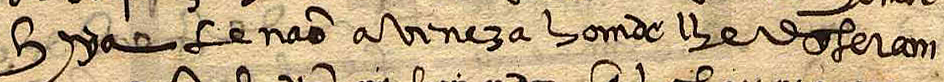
hya senaõ a veneza homde lhe dyseram
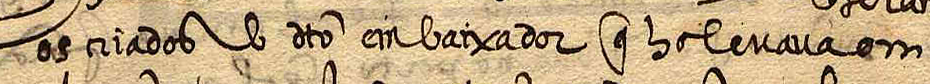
os criados do dtō embaixador q̄ ho leuauaom
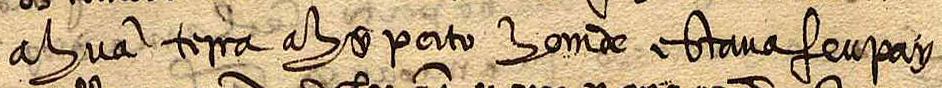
a huā terra ahy perto homde estaua seu pay
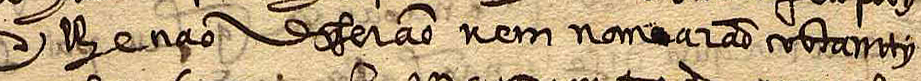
e lhe naõ dysserão nem nomearão costamty
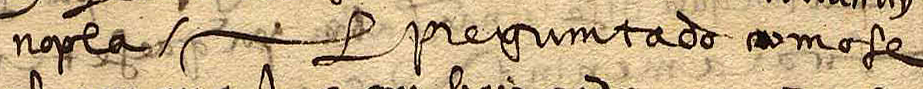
nopla / + pregumtado como se
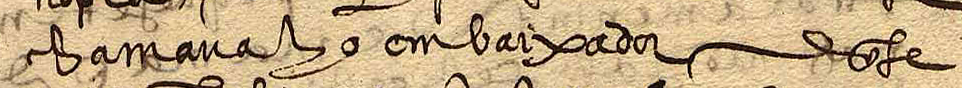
chamaua ho embaixador dyse
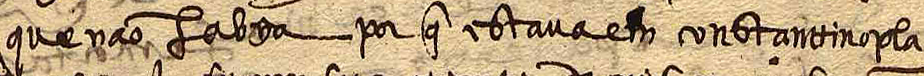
que naõ sabya porq̅ estaua em constamtinopla
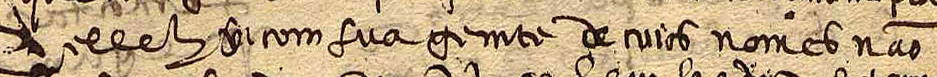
e elle hya com sua gemte de cuios nomes naõ
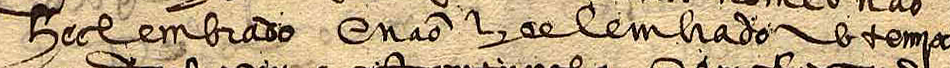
hee lembrado e naõ hee lembrado do tempo
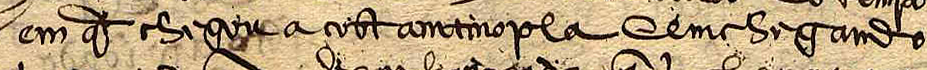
em q̄ chegou a costamtinopla e em chegando
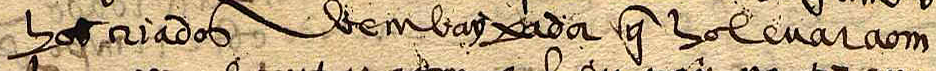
hos criados do embayxador q̄ ho leuaraom
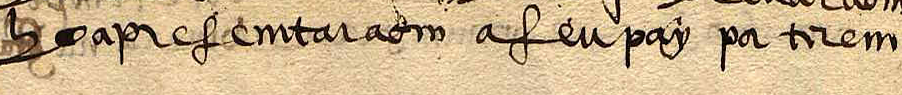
ho apresemtaraom a seu pay por terem
